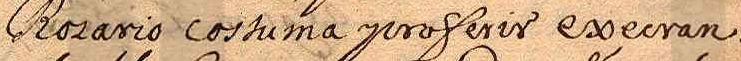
Rozario costuma proferir execran
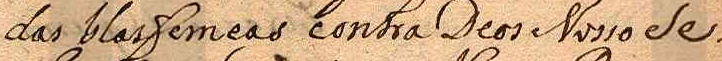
das blasfemeas contra Deos Nosso Se
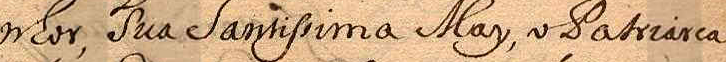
nhor, Sua Santissima May, o Patriarca
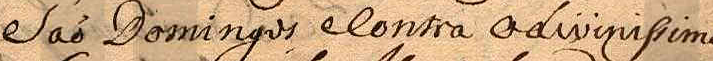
Saõ Domingos, e contra o divinissimo
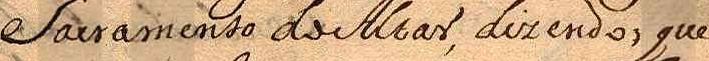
Sacramento do Altar, dizendo, que
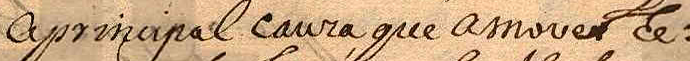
a principal cauza, que a move_ he:
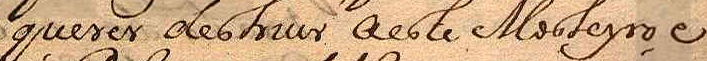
querer destruir a este Mosteyro, e
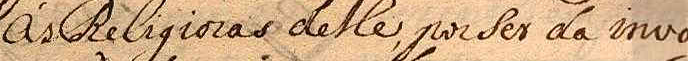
ás Religiozas delle, por ser da invo
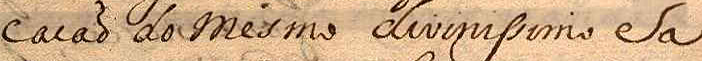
caçaõ do mesmo divinissimo Sa
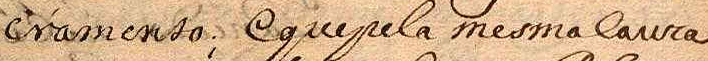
cramento, e que pela mesma cauza
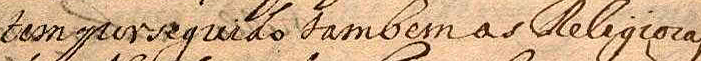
tem perseguido tambem as Religiozas
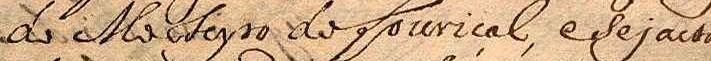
do Mosteyro do Louriçal, e se jacta
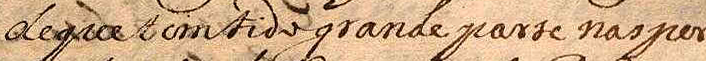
de que tem tido grande parte nas per
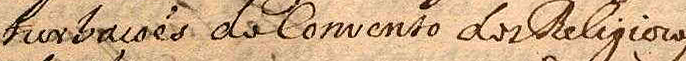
turbaçoẽs do Convento dos Religiozos
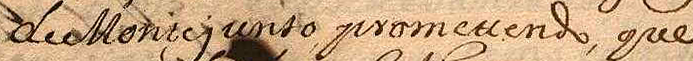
de Montejunto, promettendo, que
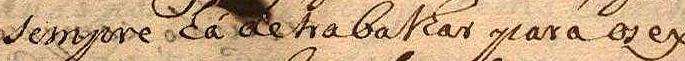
sempre há de trabalhar para os ex
